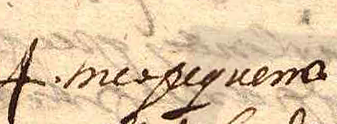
4. meo pequeno
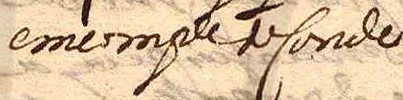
em compa do Conde
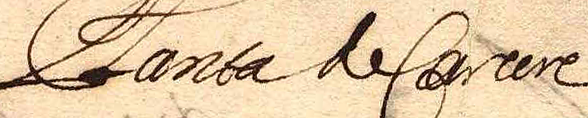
PLanta do Carcere
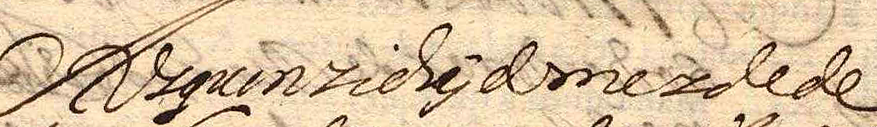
Aos quinze dias do mez de de
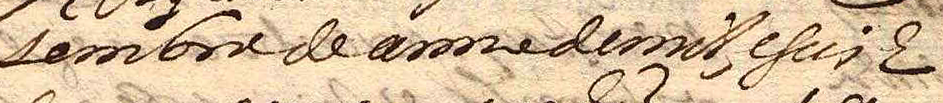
sembro do anno de mil e seis E
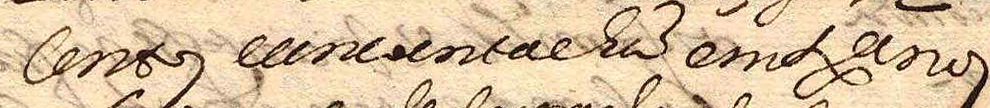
centos e cincoenta e hū em Lxa nos
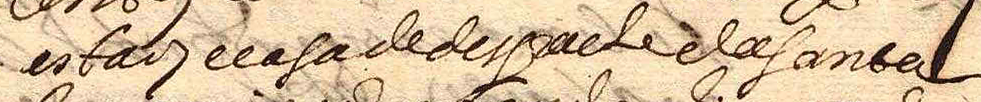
estaos e casa do despacho da santa
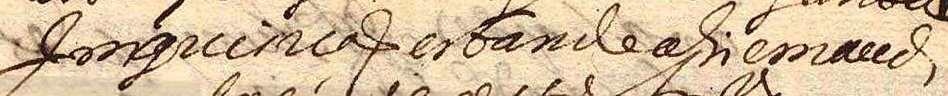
Jmquisiçaõ estando ahi em audi
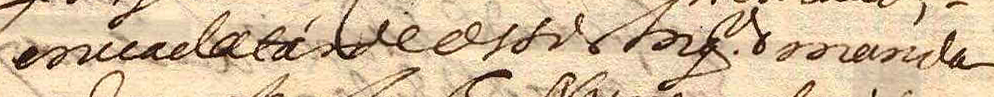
encia da tarde os sres Inq.res manda
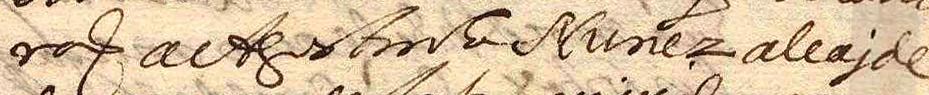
raõ a Agostinho Nunez alcajde
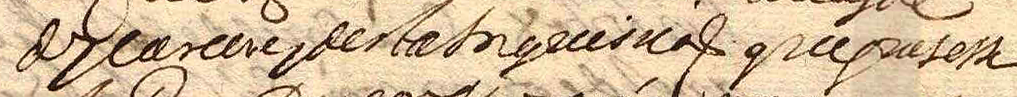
dos carceres desta Inquisiçaõ que pusesse
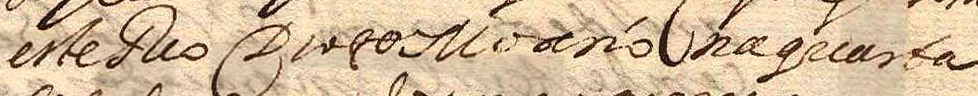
este Reo Diogo Moreno na quarta
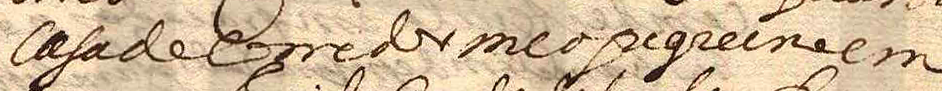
casa do corredor meo pequeno em
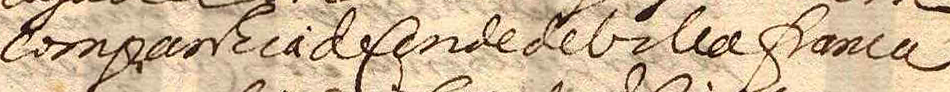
companhia do Conde de Villa franca
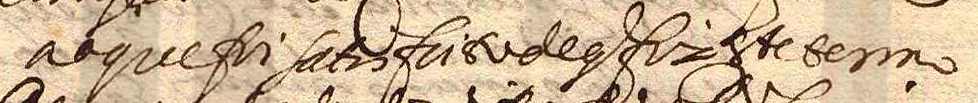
ao que foi satisfeito de q̄ fiz este termo
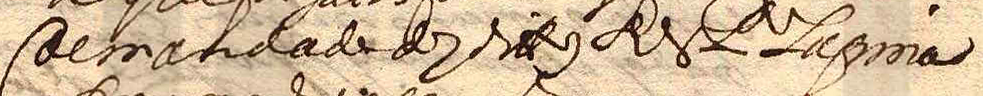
de mandado dos dittos sres Po Lupina
